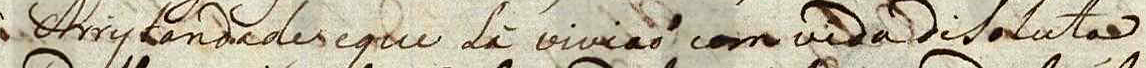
Christandade e que Lá viviaō com vida disoluta
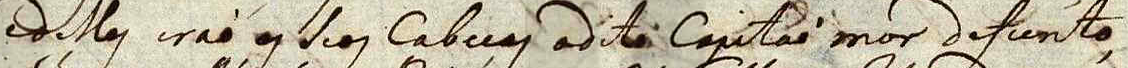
e delles eraõ os seos Cabeças o dito Capitaõ mor defunto
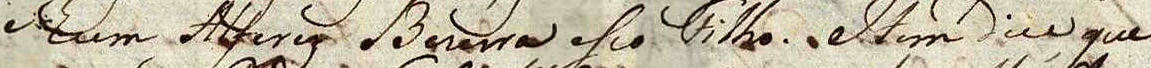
e hum Alferes Bezerra e seo Filho. Item dice que
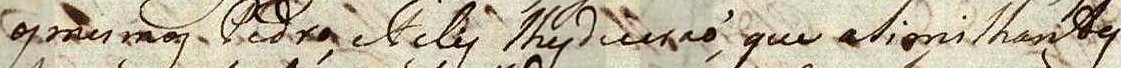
os mesmos Pedro, e Felis lhes diceraō, que a Similhantes
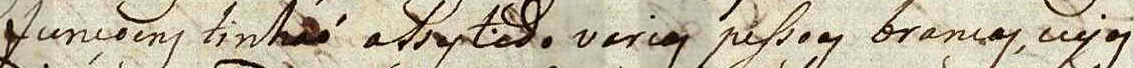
funçoens tinhaõ assistido varias pessoas brancas, cujos
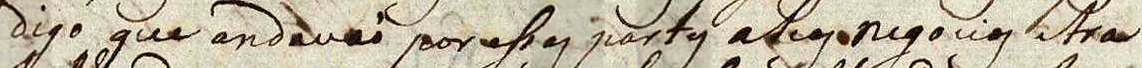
digo que andavaõ por essas partes e seos negocios e tra
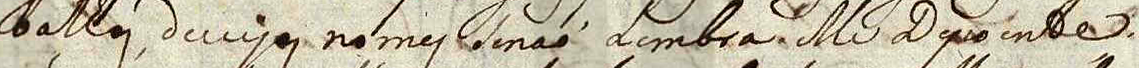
balhos de cujas no mes se naõ Lembra elle Depoente.
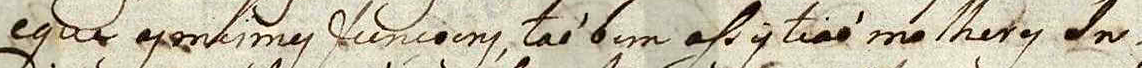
e que as mesmas funçoens, taõ bem assistiaõ molheres In
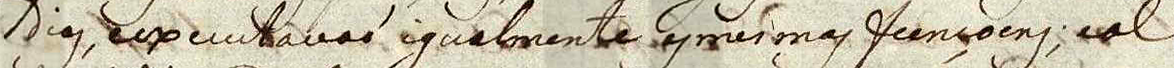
dias, e executavaō igualmente as mesmas funçoens. e al
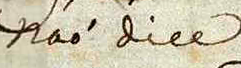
naõ dice
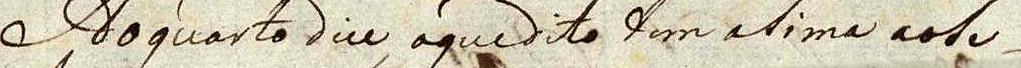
Ao quarto dice, o que dito tem asima ao Se
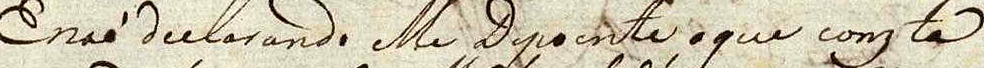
E naõ declarando elle Depoente o que consta
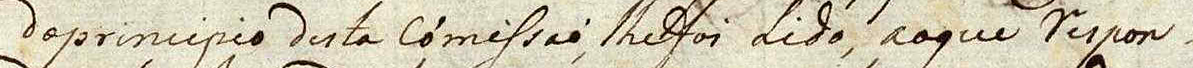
do principio desta Cōmissaõ, lhe foi Lido, ao que respon
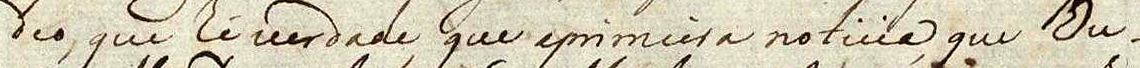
deo, que hé uerdade que a primeira noticia, que Ou
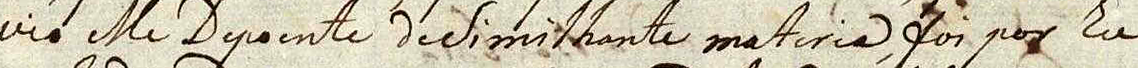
vio elle Depoente de Similhante materia, foi por hu
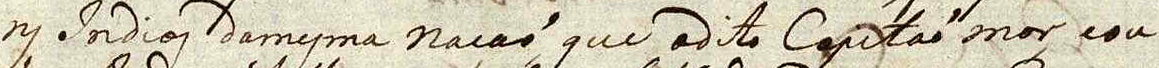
ns Indios da mesma naçaõ que o dito Capitaõ mor e ou
